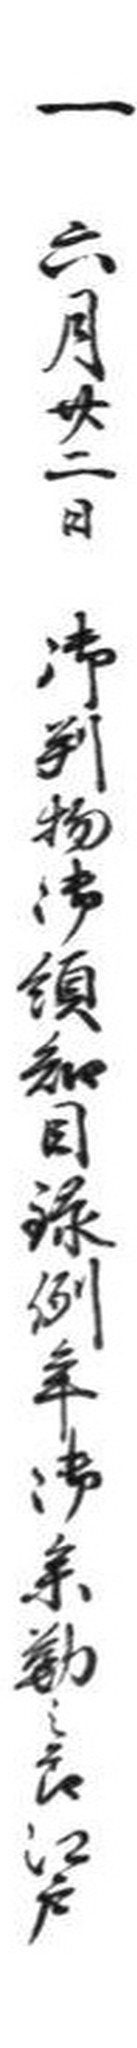一六月廿二日御判物御領知目録例年御参勤之節江戸
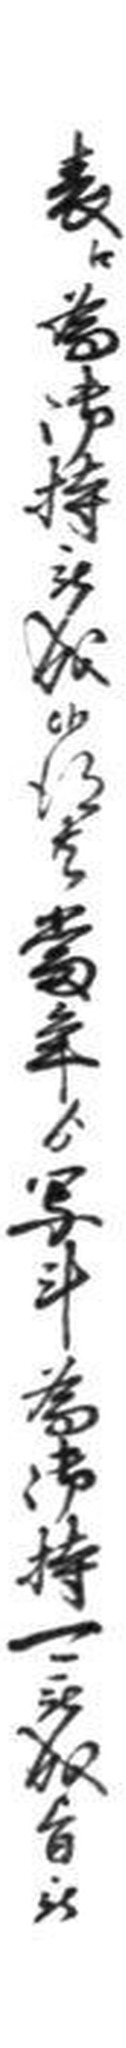表江為御持被成候得共当年ゟ写斗為御持可被成旨被
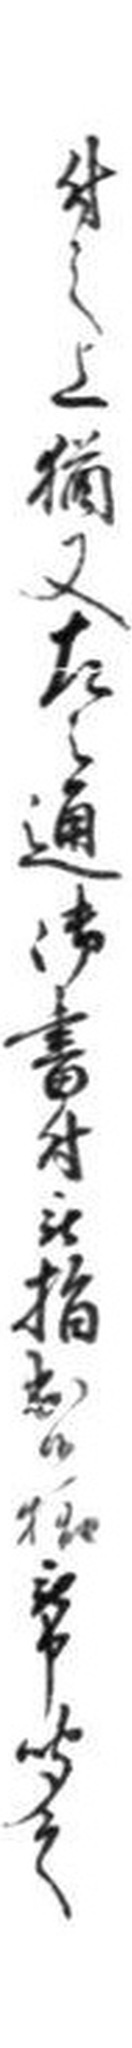付之上猶又左之通御書付被指出候様被申聞之
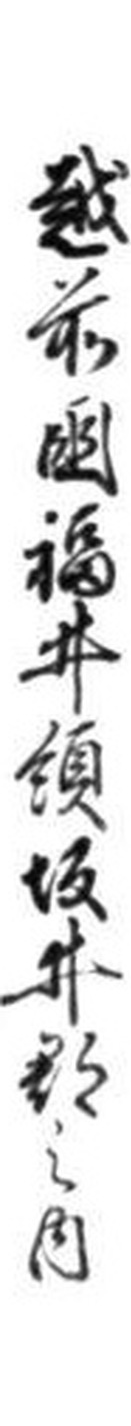越前国福井領坂井郡之内
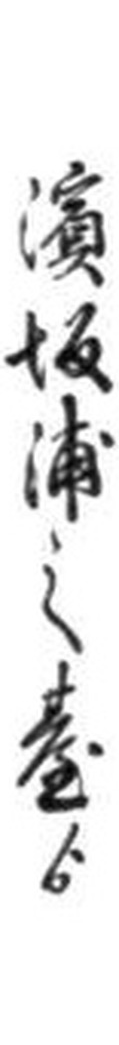浜坂浦之台ゟ
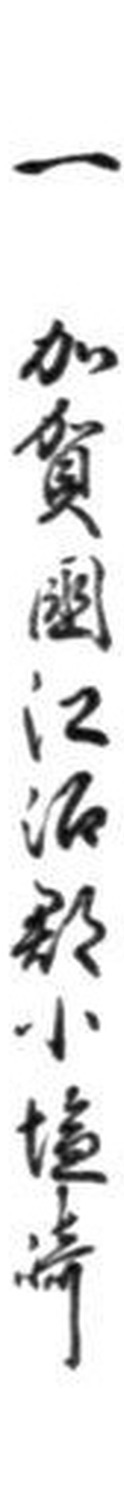一加賀国江沼郡小塩崎
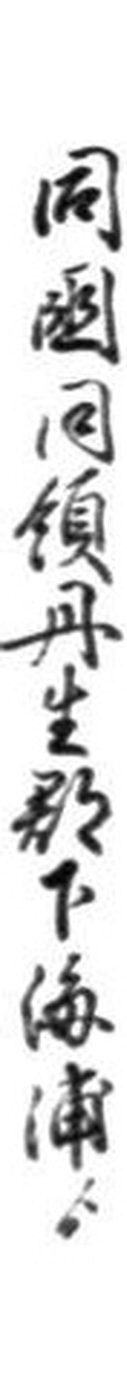同国同領丹生郡下海浦ゟ
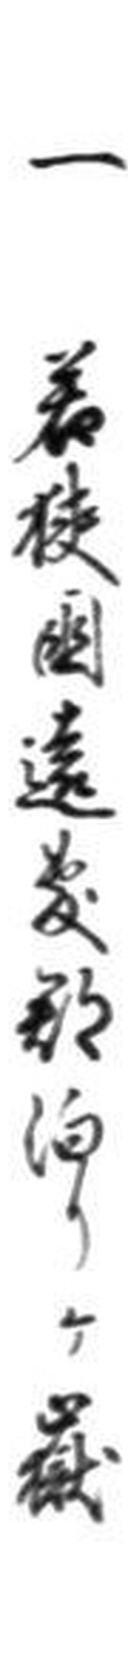一若狭国遠敷郡泊りケ嶽
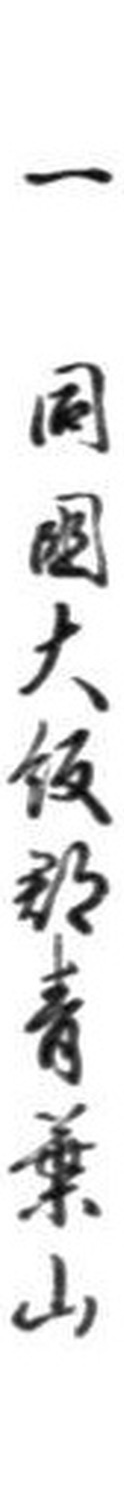一同国大飯郡青葉山
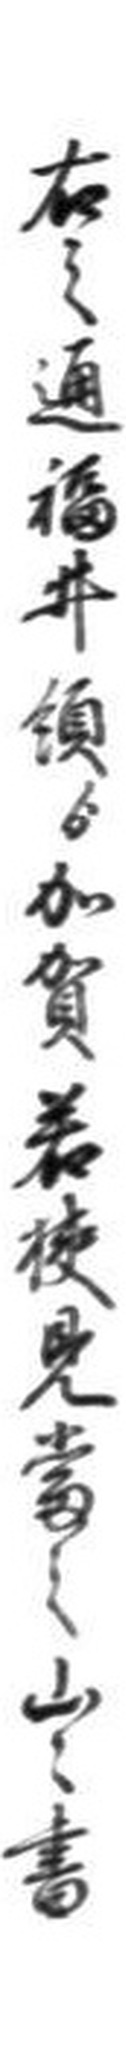右之通福井領ゟ加賀若狭見当之山々書
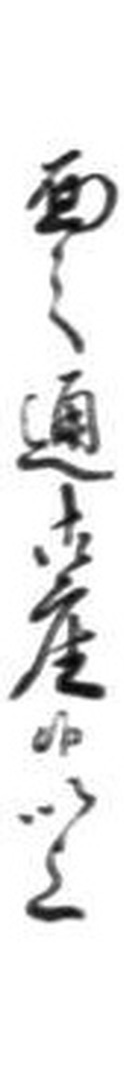面之通御座候以上
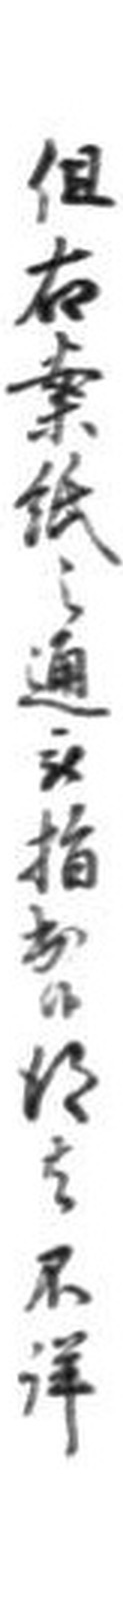但右案紙之通被指出候得共不詳
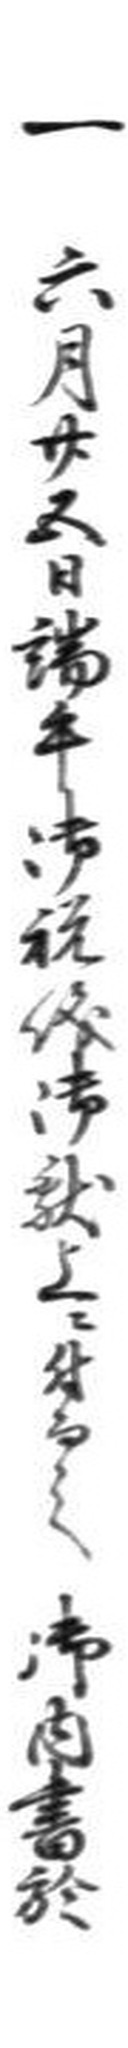一六月廿五日端午御祝儀御献上ニ付而之御内書於
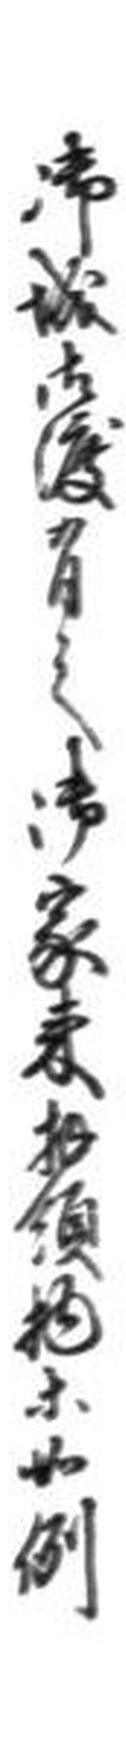御城御渡有之御家来拝領物等如例
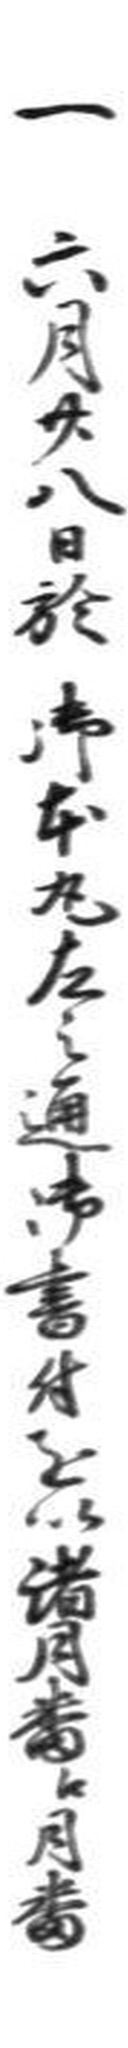一六月廿八日於御本丸左之通御書付を以諸月番江月番

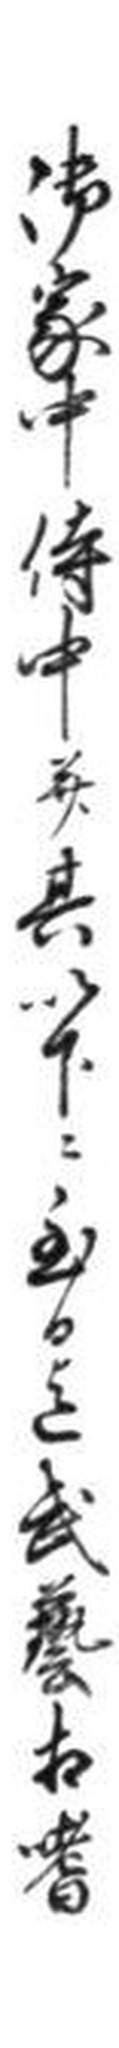御家中侍中并其以下ニ至る迄武芸相嗜
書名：家譜 三十二 吉邦公 従享保二年到享保三年
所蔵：福井県文書館 Fukui Prefectural Archives
